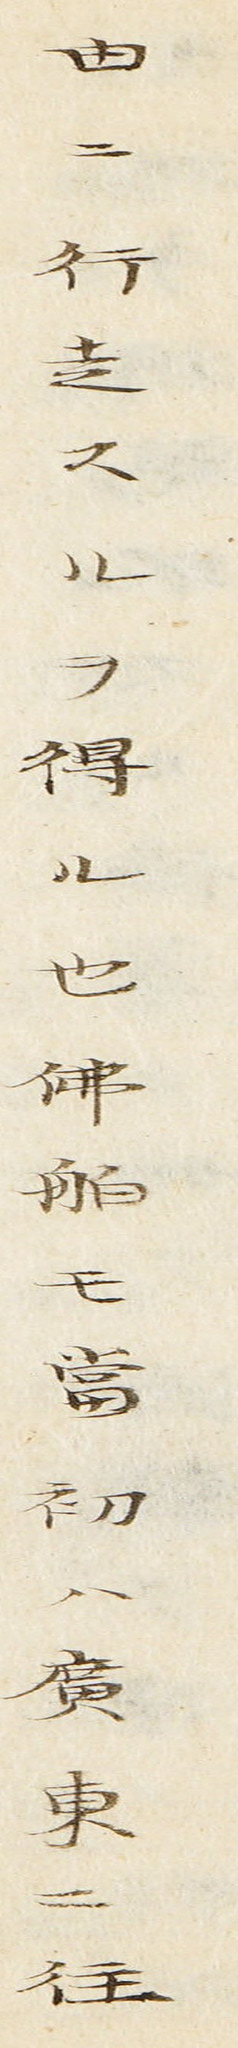由ニ行走スルヲ得ル也仏舶モ当初ハ広東ニ往
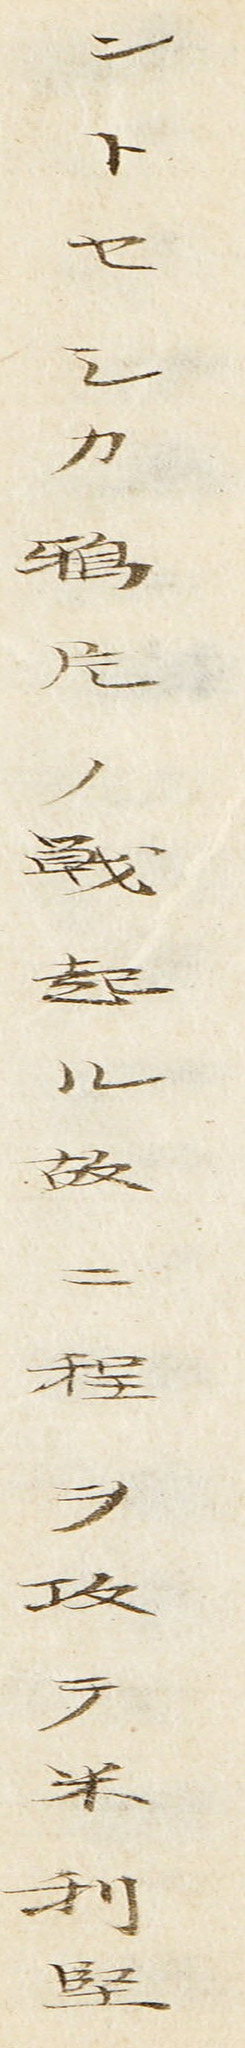ントセシカ鴉片ノ戦起ル故ニ程ヲ攻テ米利堅
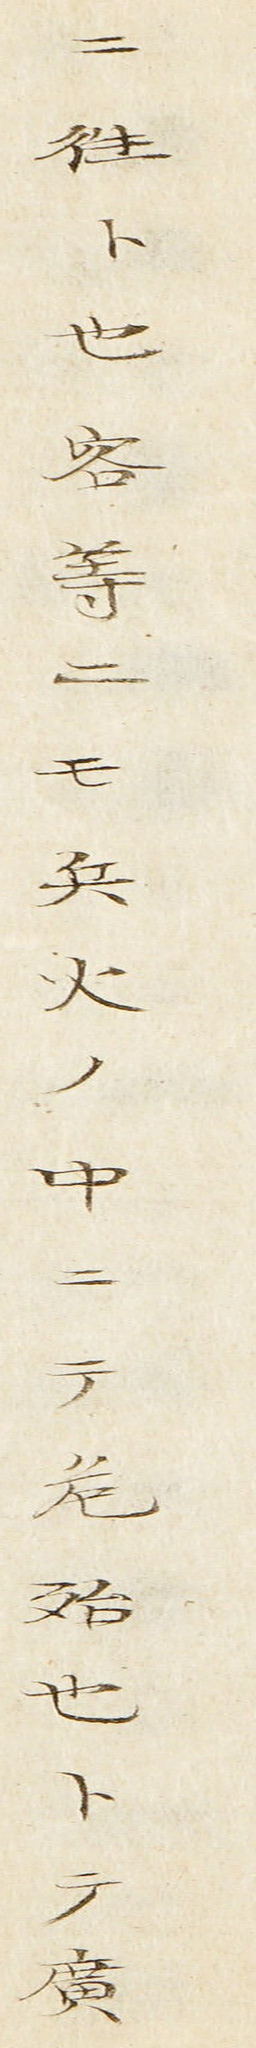ニ往ト也客等ニモ兵火ノ中ニテ危殆也トテ広
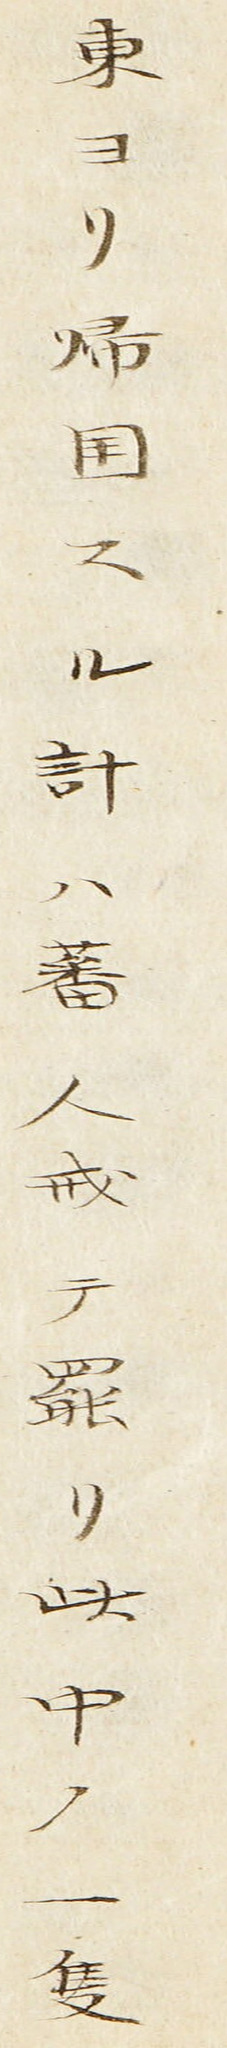東ヨリ帰国スル計ハ蕃人戒テ罷リ此中ノ一隻
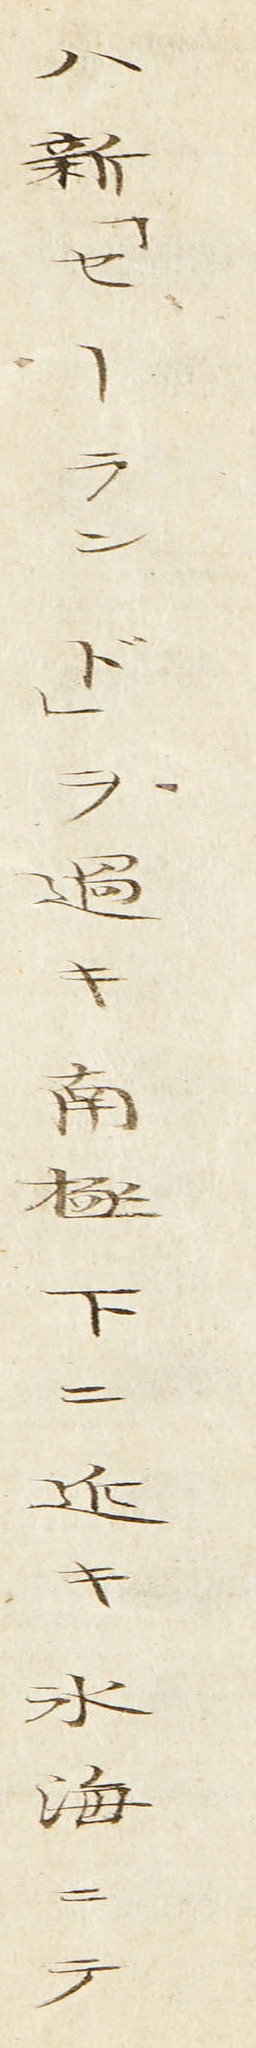ハ新「セーランド」ヲ過キ南極下ニ近キ氷海ニテ
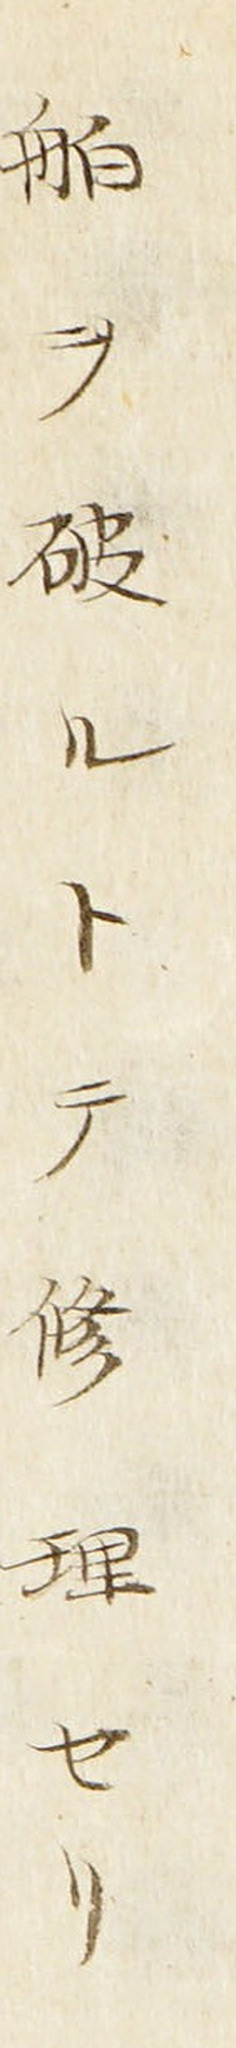舶ヲ破ルトテ修理セリ
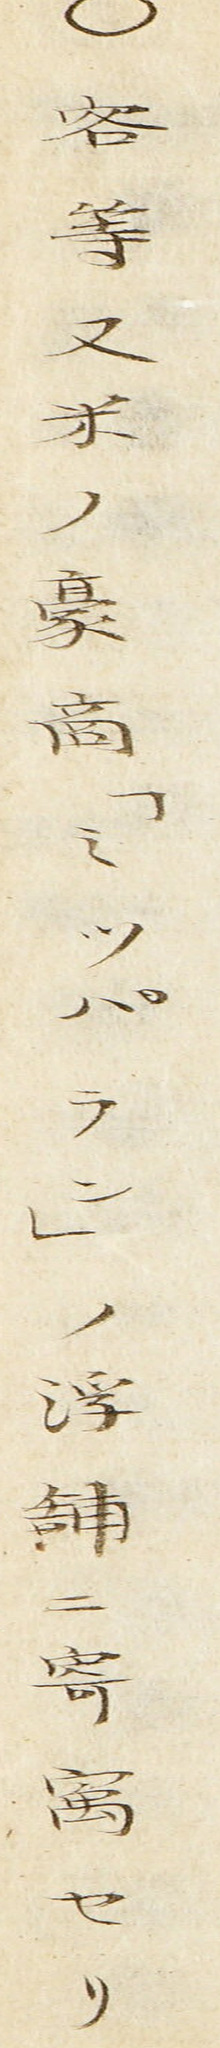○客等又米ノ豪商「ミツパラン」ノ浮舗ニ奇寓セリ

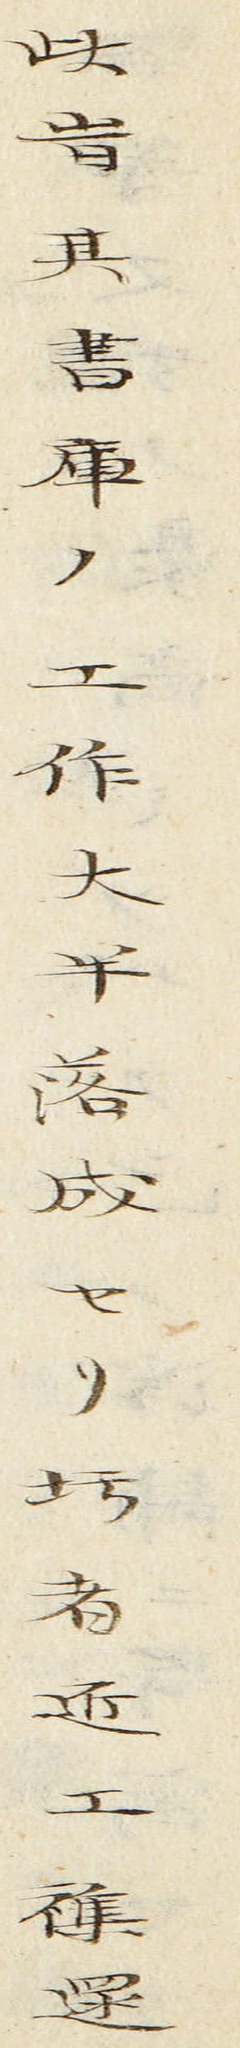此旹其書庫ノ工作大半落成セリ圬者近工襍遝
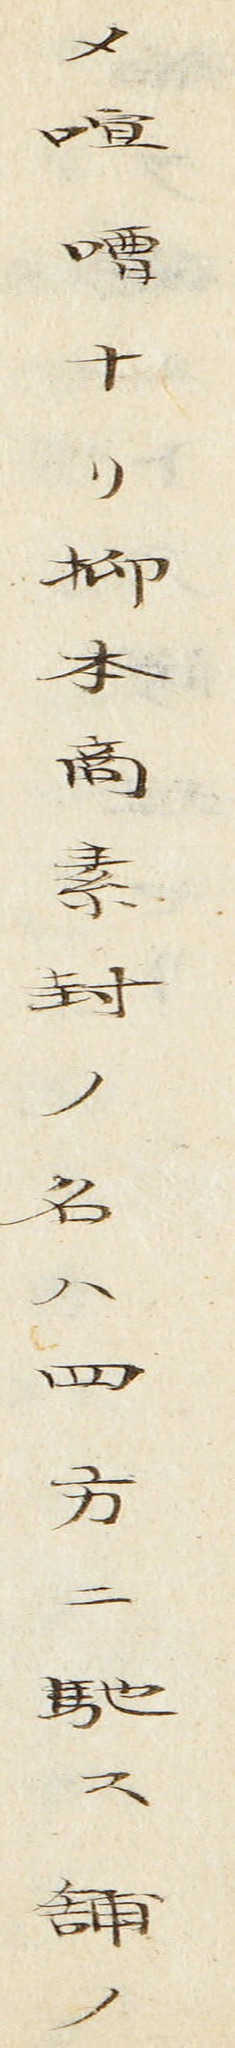シテ喧嘈ナリ抑本商素封ノ名ハ四方ニ馳ス舗ノ
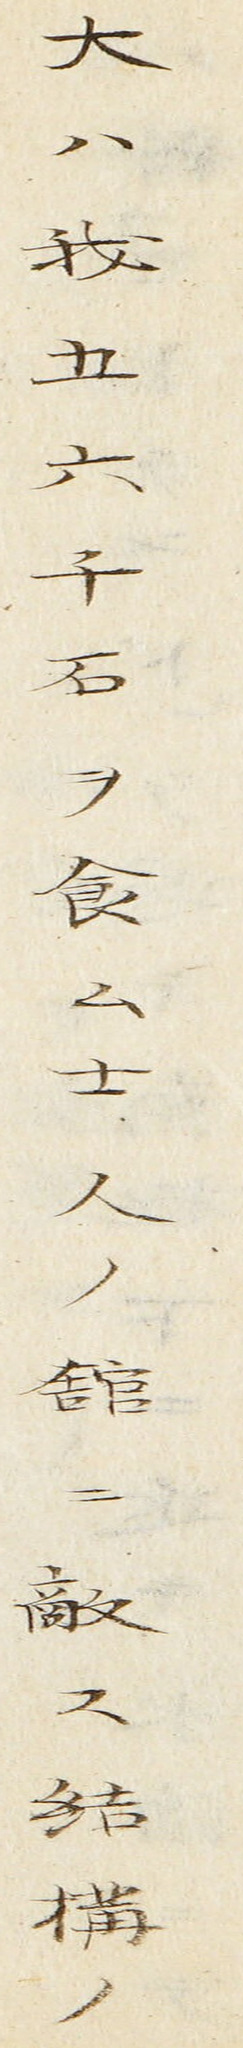大ハ我五六千石ヲ食ム士人ノ館ニ敵ス結構ノ
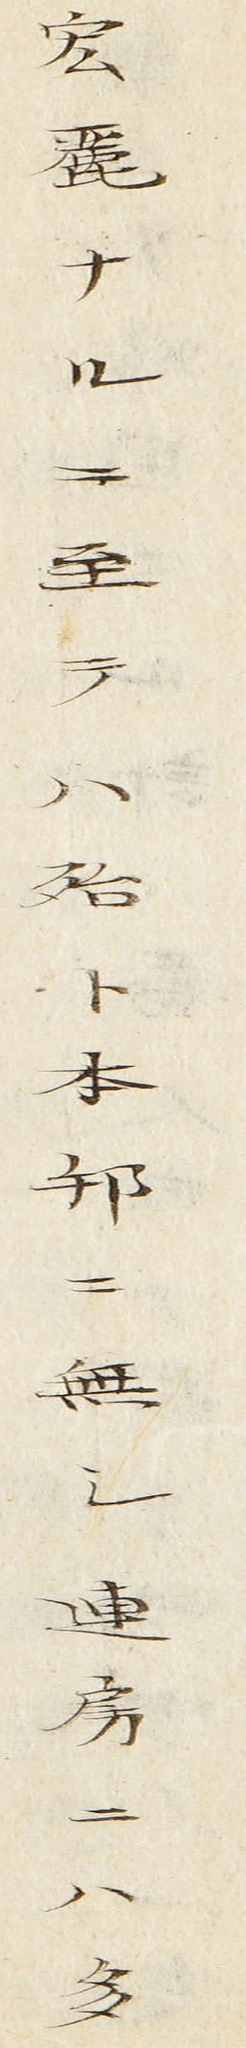宏麗ナルニ至テハ殆ト本邦ニ無シ連房ニハ多
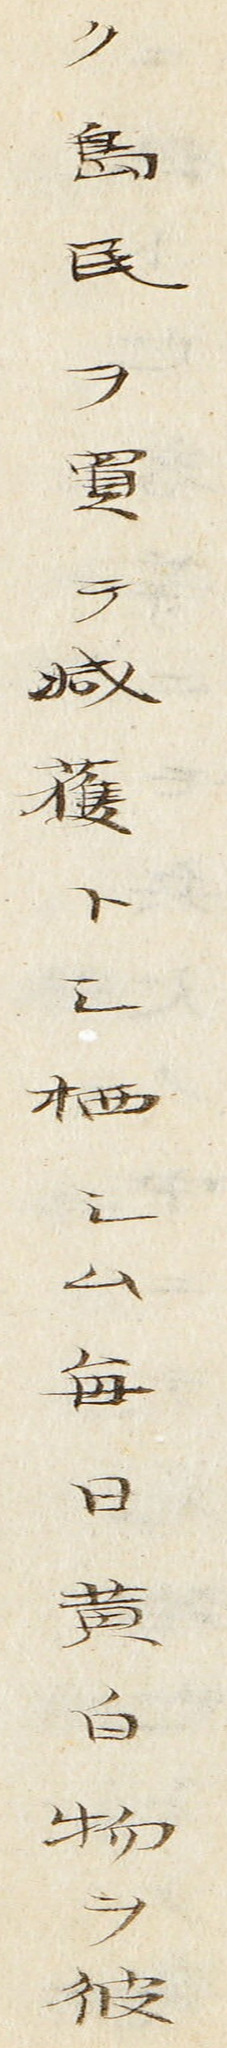ク島民ヲ買テ减檴トシ栖シム毎日黄白物ヲ彼
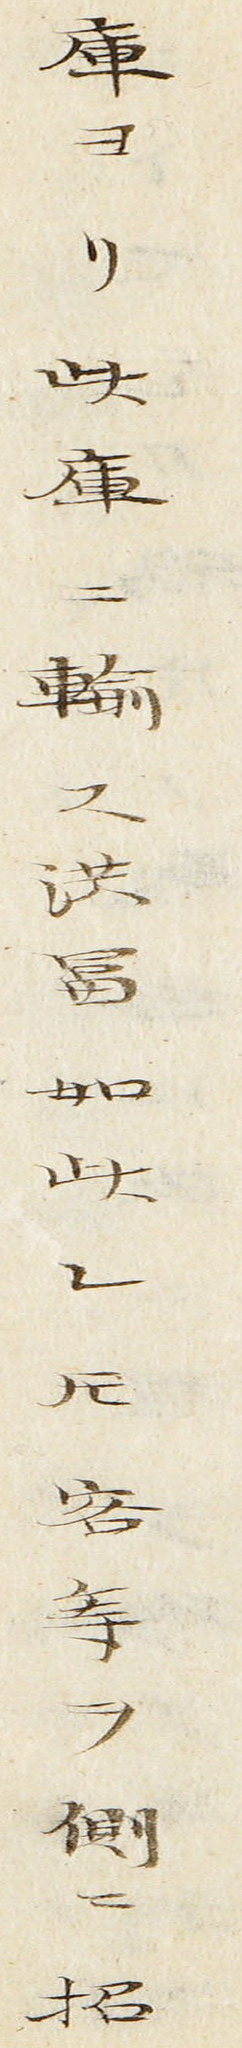庫ヨリ此庫ニ輸ス洪富如此レトモ客等ヲ側ニ招
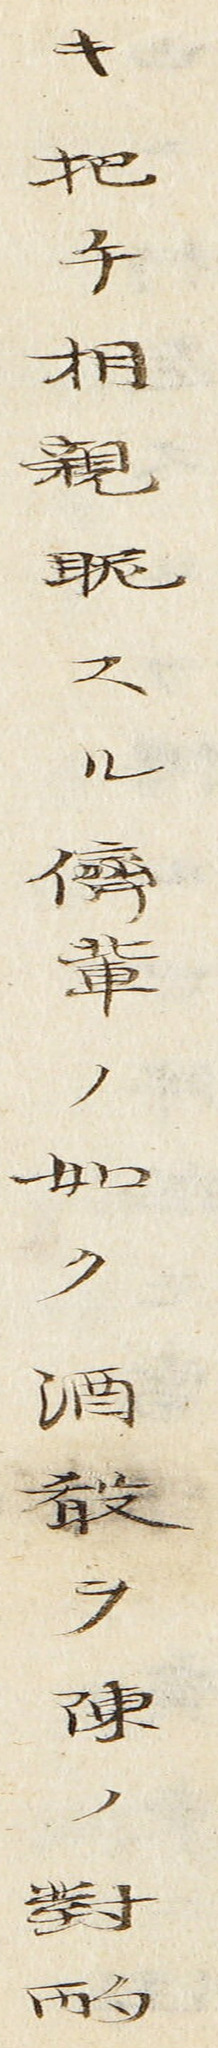キ把手相親眤スル儕軰ノ如ク酒殽ヲ陳ノ対酌
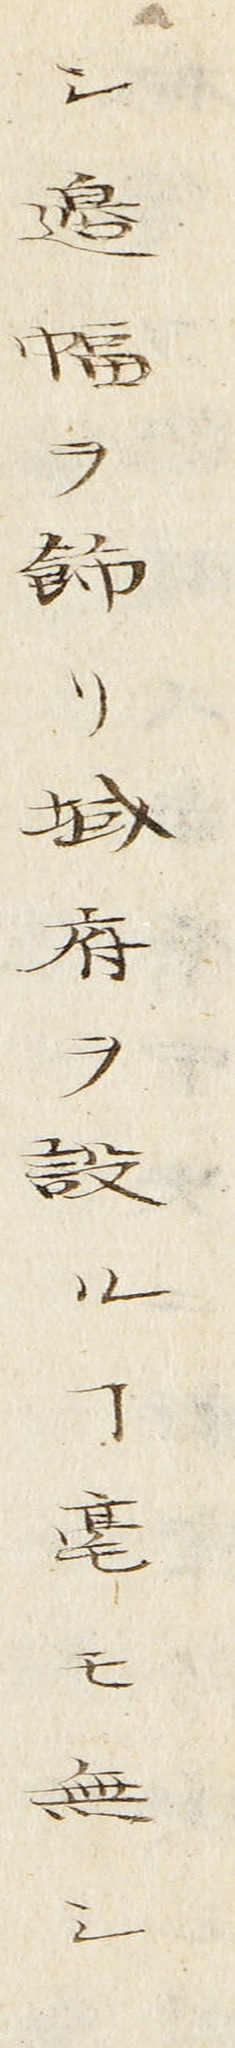シ辺幅ヲ飾リ域府ヲ設ルコト毫モ無シ
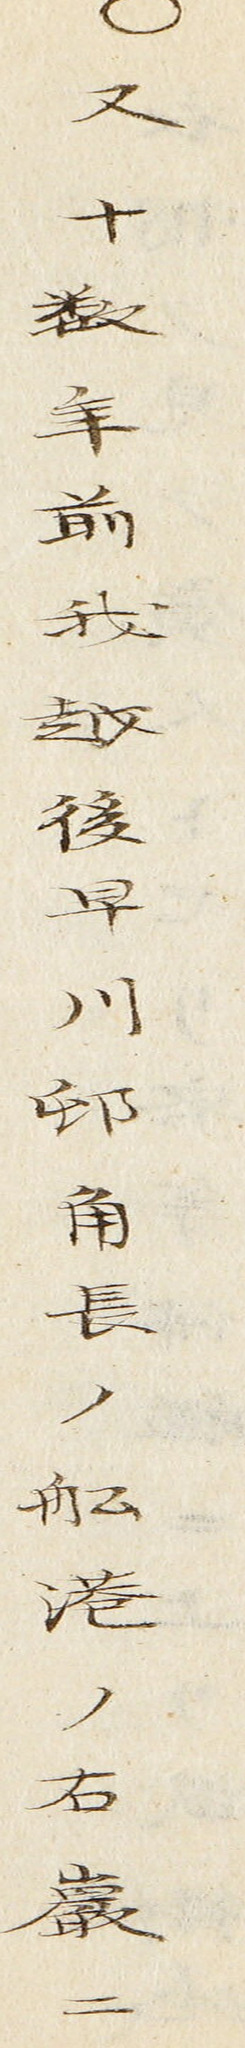○又十数年前我越後早川邨角長ノ船港ノ右巖ニ
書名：流蕃通書
